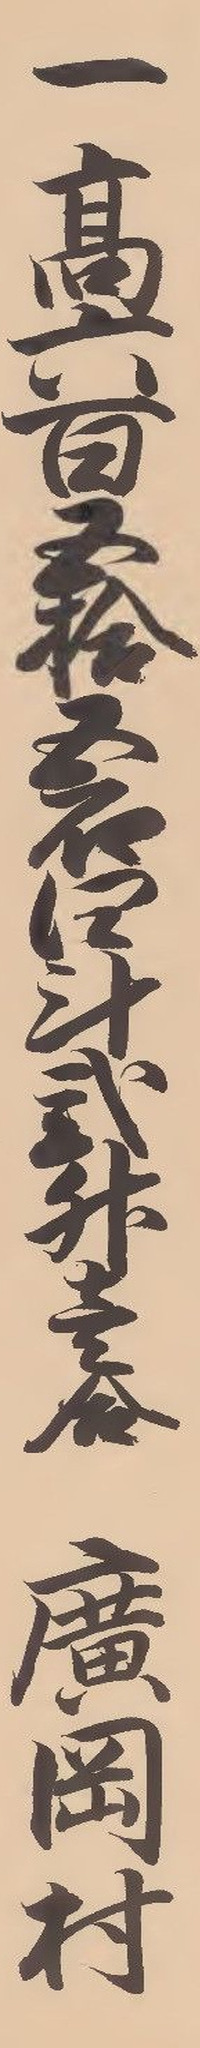一高六百五拾五石四斗弐升壱合広岡村
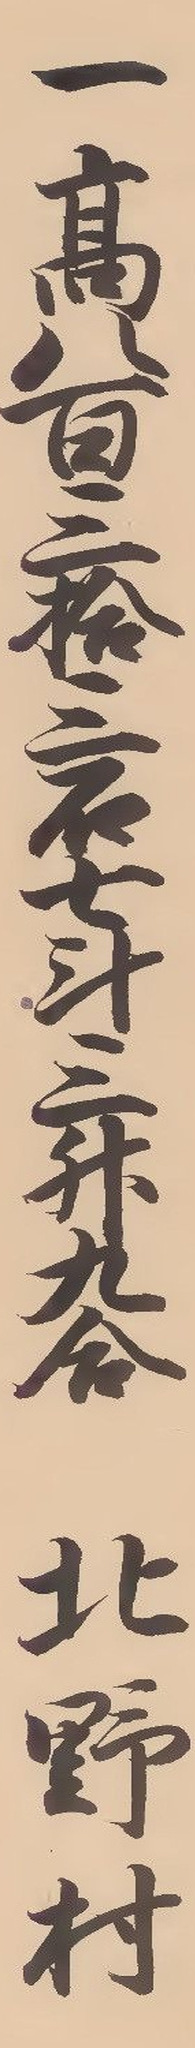一高八百三拾三石七斗三升九合北野村

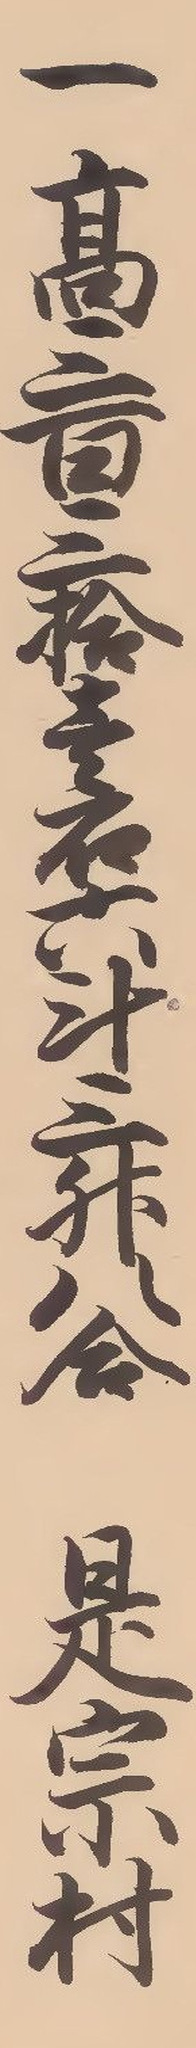一高三百三拾壱石六斗三升八合是宗村
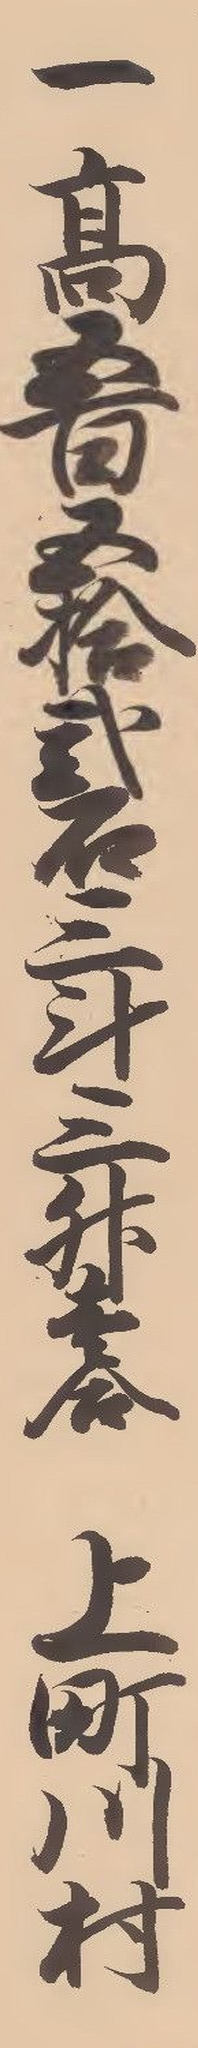一高五百五拾弐石三斗三升壱合上町川村
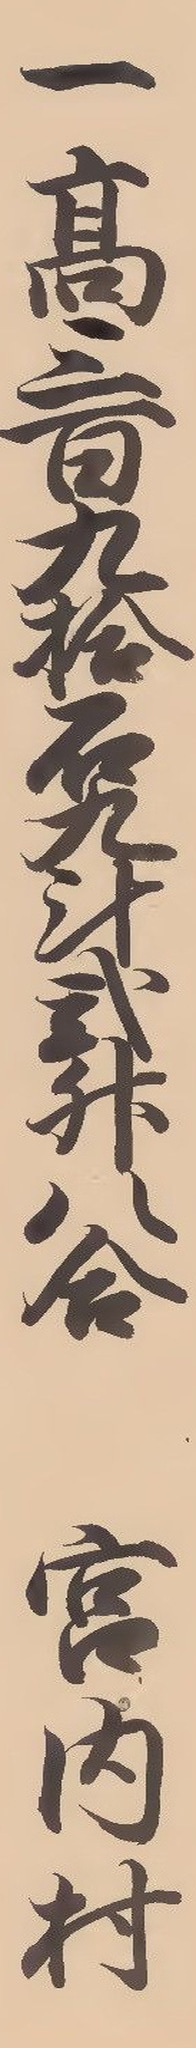一高三百九拾石九斗弐升八合宮内村
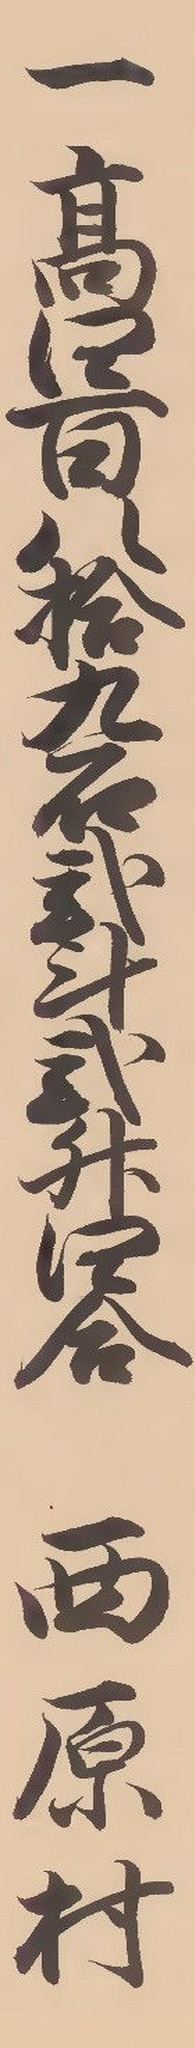一高四百八拾九石弐斗弐升四合西原村
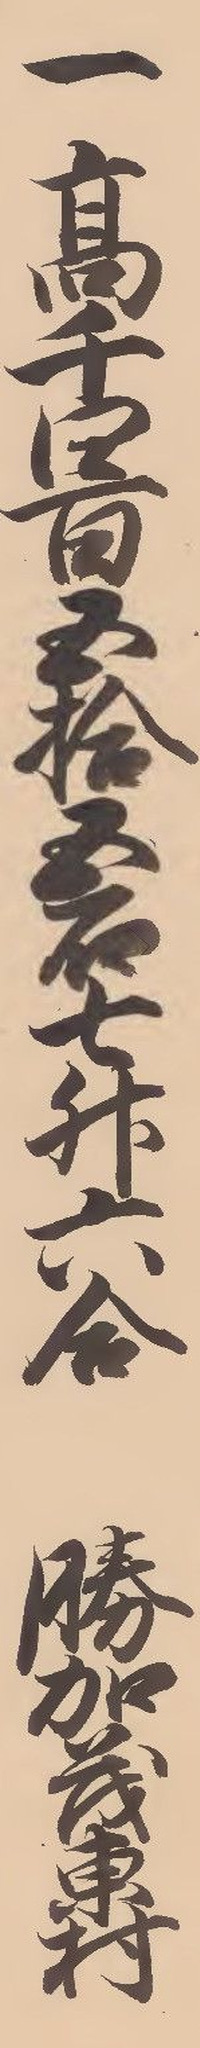一高千四百五拾五石七升六合勝加茂東村
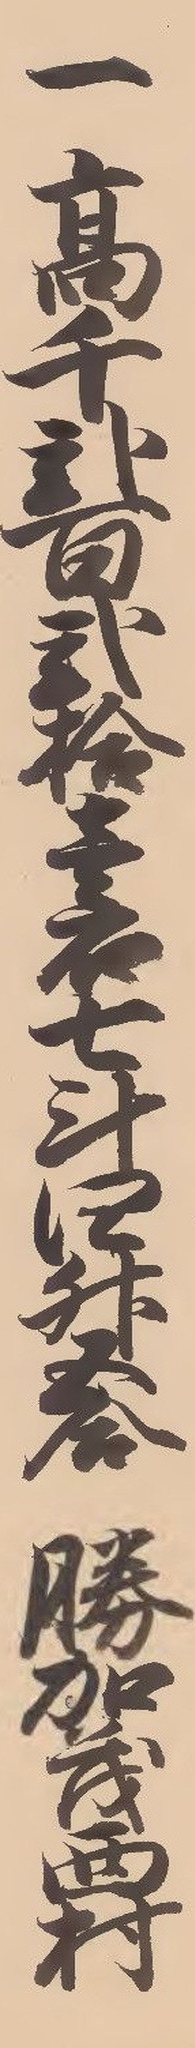一高千弐百弐拾壱石七斗四升五合勝加茂西村
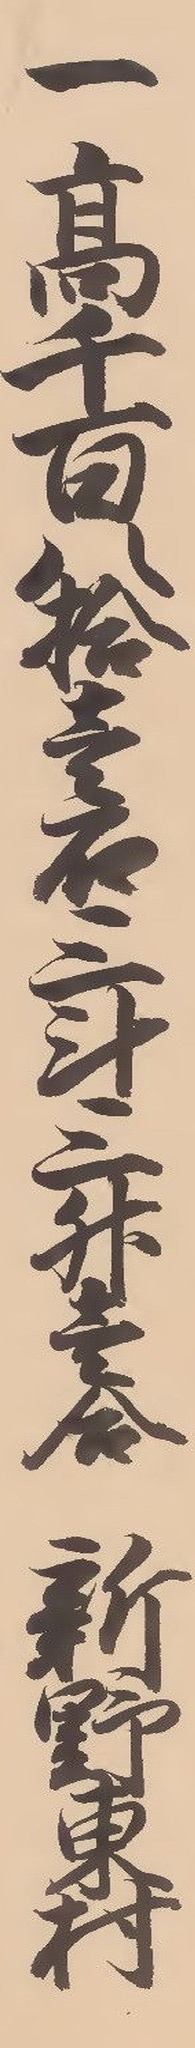一高千百八拾壱石三斗三升壱合新野東村
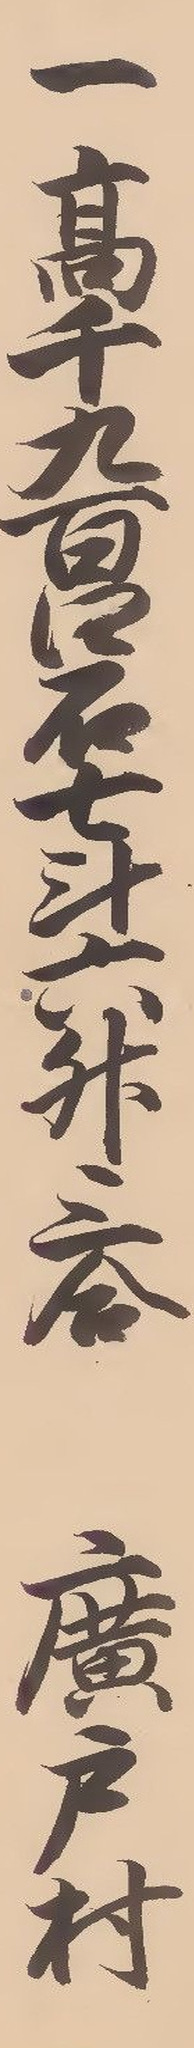一高千九百四石七斗六升三合広戸村

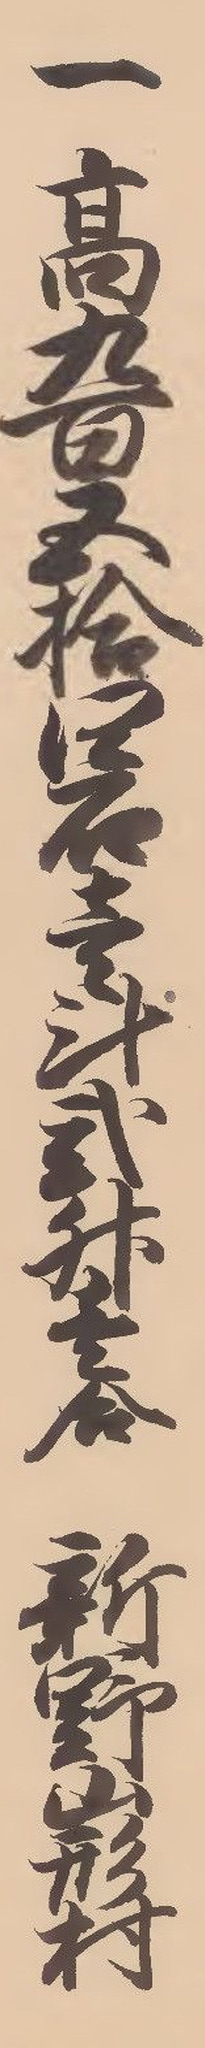一高九百五拾四石壱斗弐升壱合新野山形村
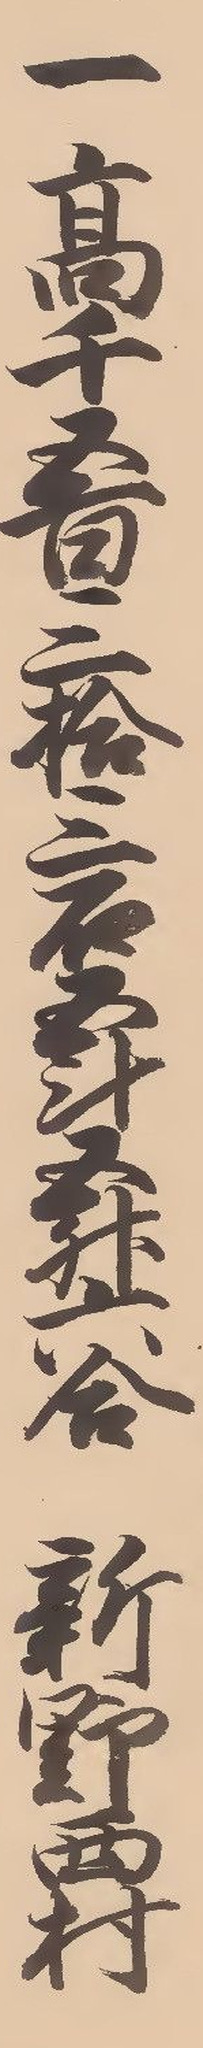一高千五百三拾三石五斗五升六合新野西村
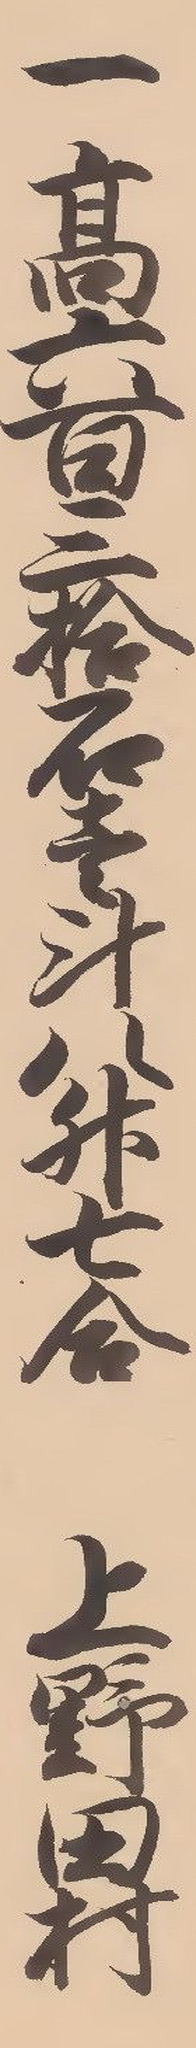一高六百三拾石壱斗八升七合上野田村
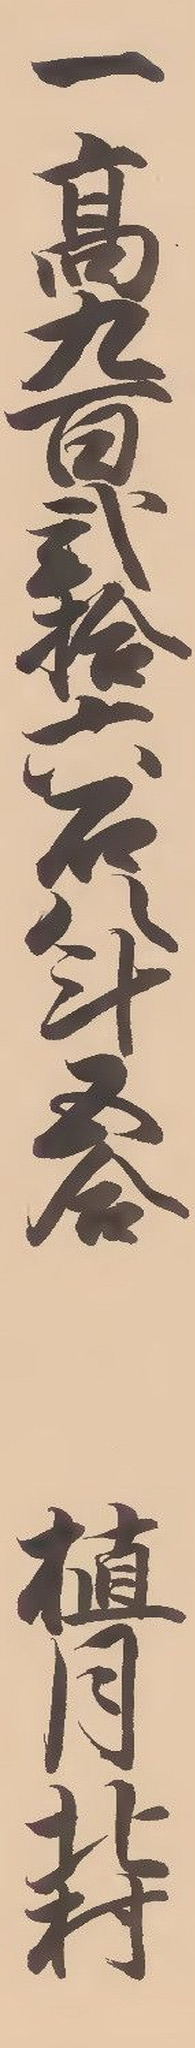一高九百弐拾六石八斗五合植月北村
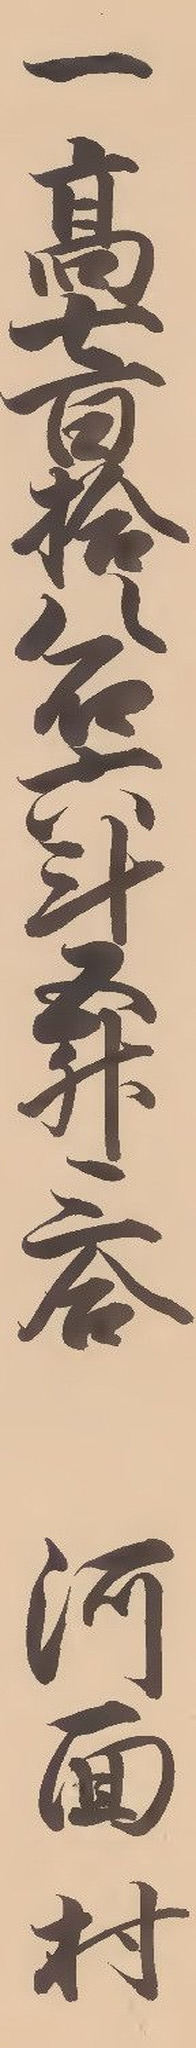一高七百拾八石六斗五升三合河面村
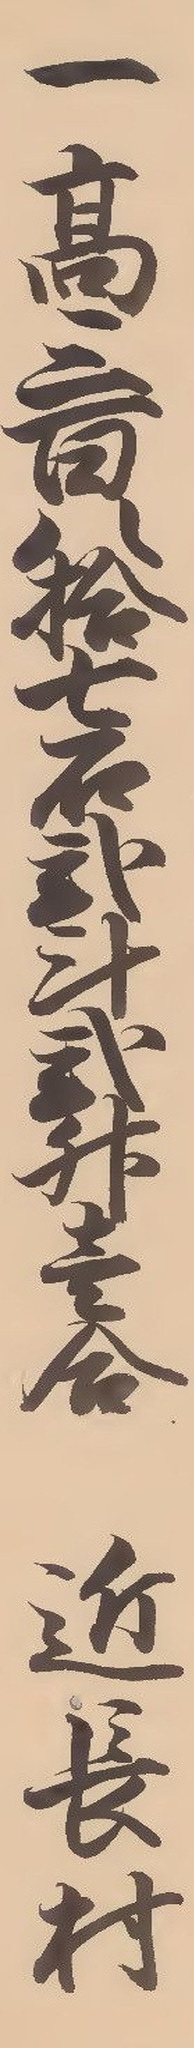一高三百八拾七石弐斗弐升壱合近長村
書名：美作国郷帳
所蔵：国立公文書館 National Archives of Japan
